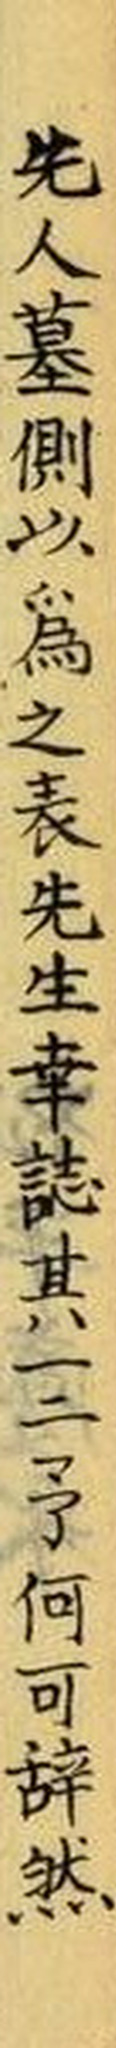先人墓側以為之表先生幸誌其一二予何可辞然
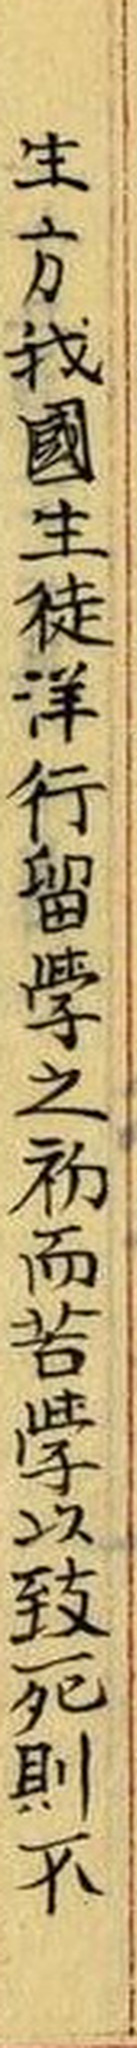生方我国生徒洋行留学之初而苦学以致死則不
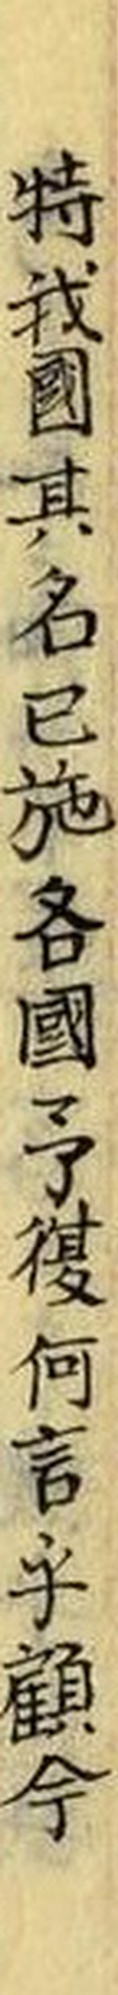特我国其名已施各国予復何言乎顧今
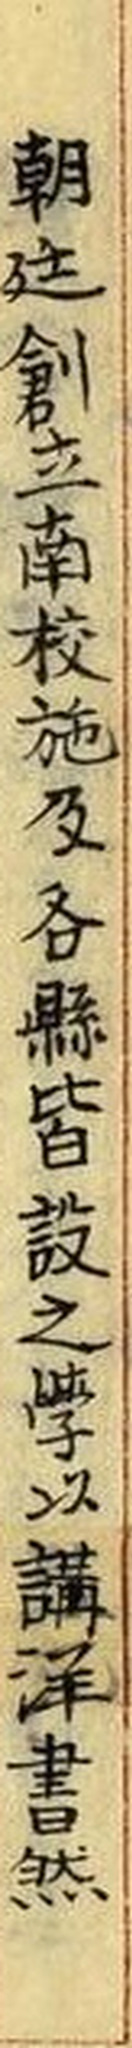朝廷創立南校施及各県皆設之学以講洋書然
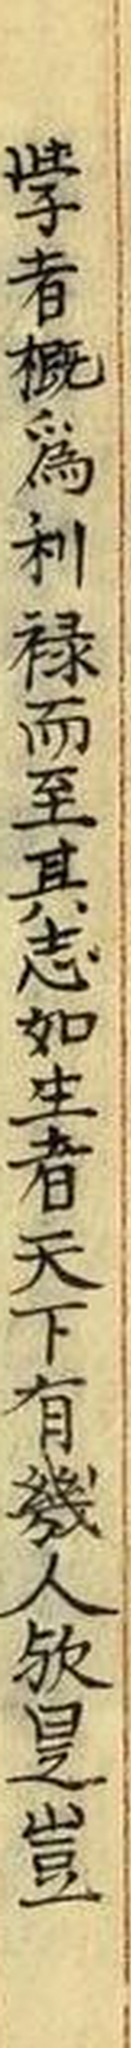学者概為利禄而至其志如生者天下有幾人歟是豈
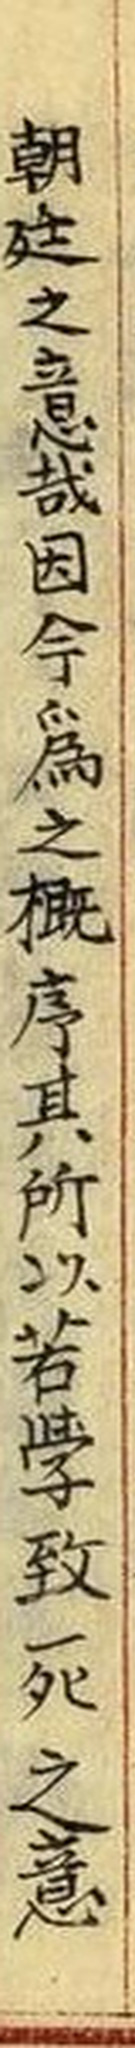朝廷之意哉因今為之概序其所以若学致死之意
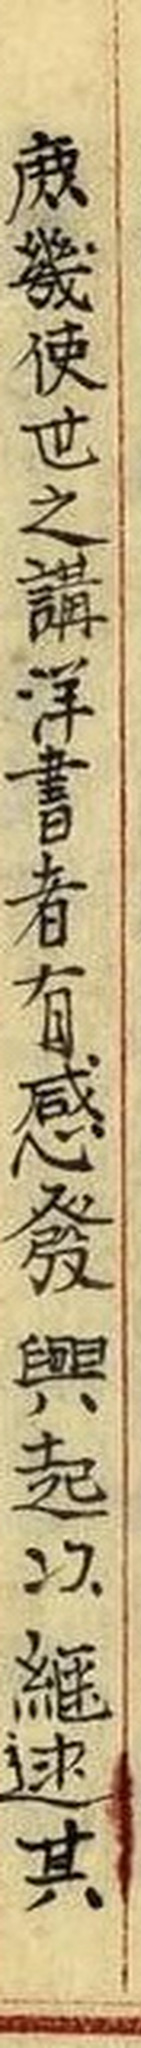庶幾使世之講洋書者有感発与起以継述其
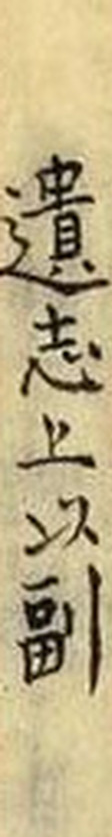遺志上以副
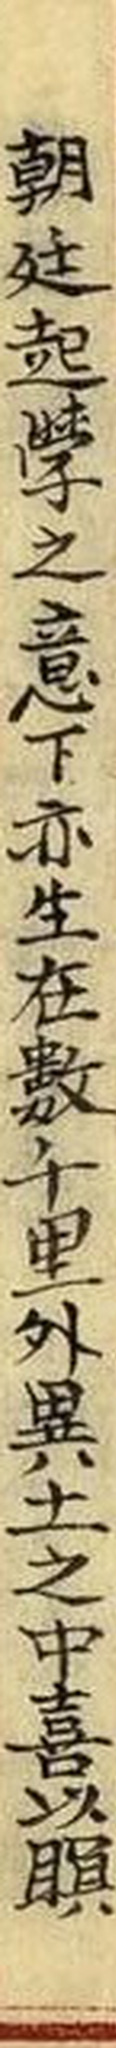朝廷起学之意下亦生在数千里外異土之中喜以瞑
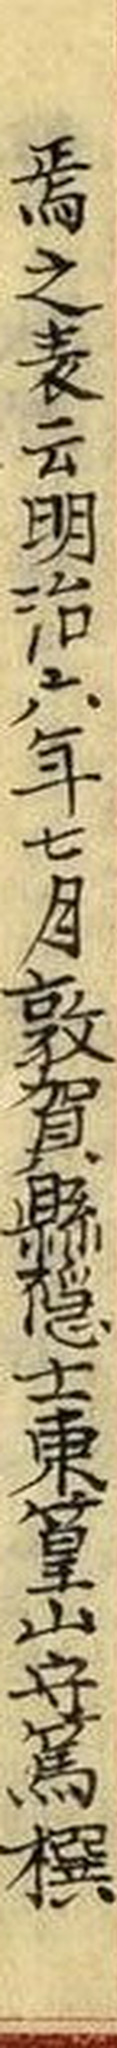焉之表云明治六年七月敦賀県隠士東篁山守篤㯢
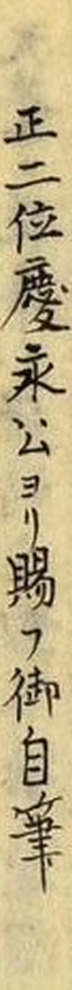正二位慶永公ヨリ賜フ御自筆
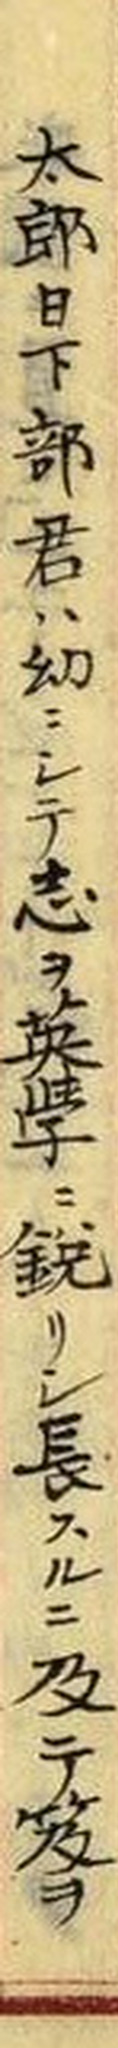太郎日下部君ハ幼ニシテ志ヲ英学ニ鋭リシ長スルニ及テ笈ヲ

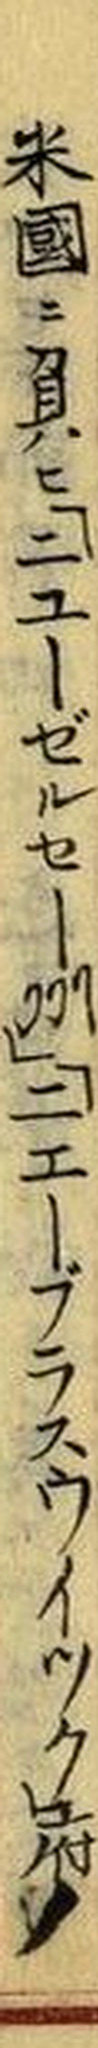米国ニ負ヒ「ニユーゼルセー州」「ニエーブラスウイツク」府ノ
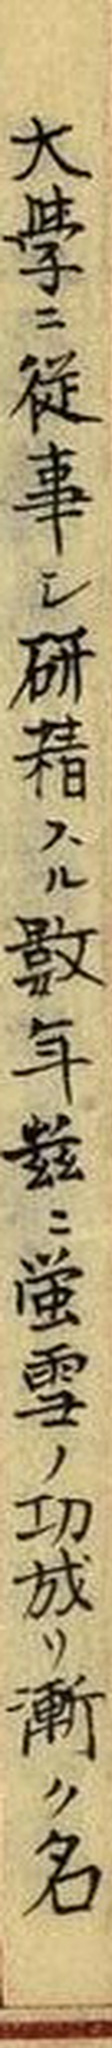大学ニ従事シ研精スル数年茲ニ蛍雪ノ功成リ漸ク名
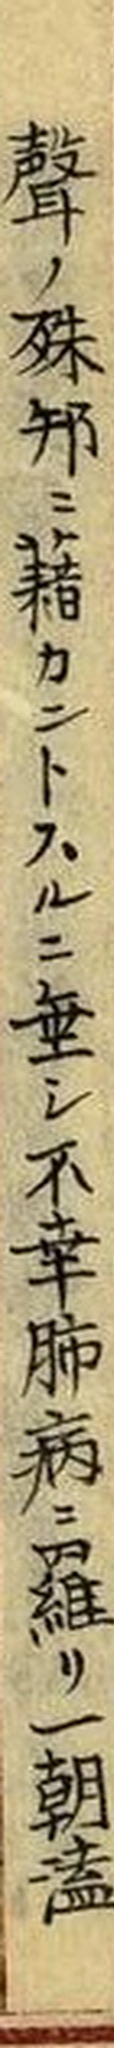声ノ殊邦ニ籍カントスルニ垂シ不幸肺病二罹リ一朝溘
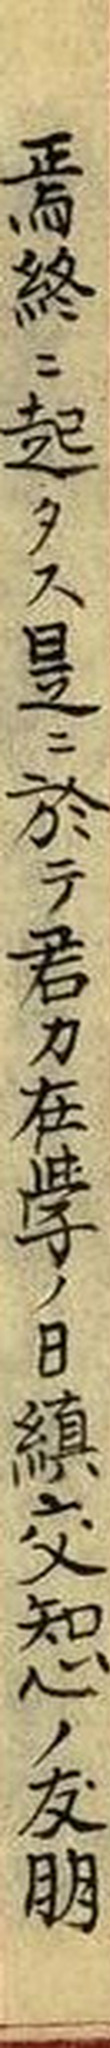焉終ニ起タス是ニ於テ君カ在学ノ日縝交知心ノ友朋
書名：温古集 三巻
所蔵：福井県文書館 Fukui Prefectural Archives
